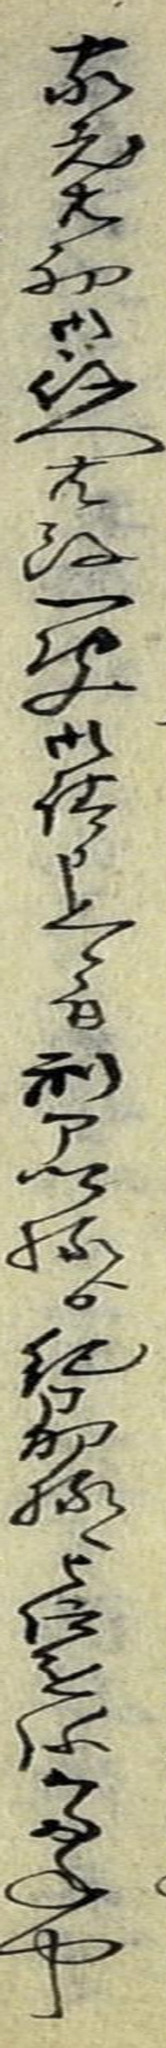家老共初御役人共致一決御請申上候に付刑部卿様ゟ紀州様へ被仰進弥当年中
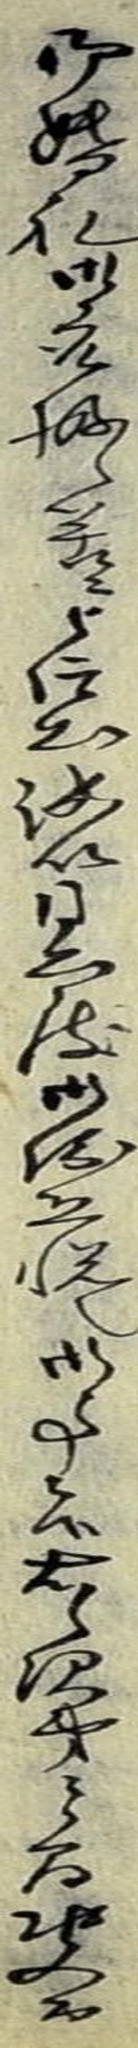御婚礼御取扱候筈に被仰出誠以目出度御儀恐悦之御事に候右之次第に候間決而
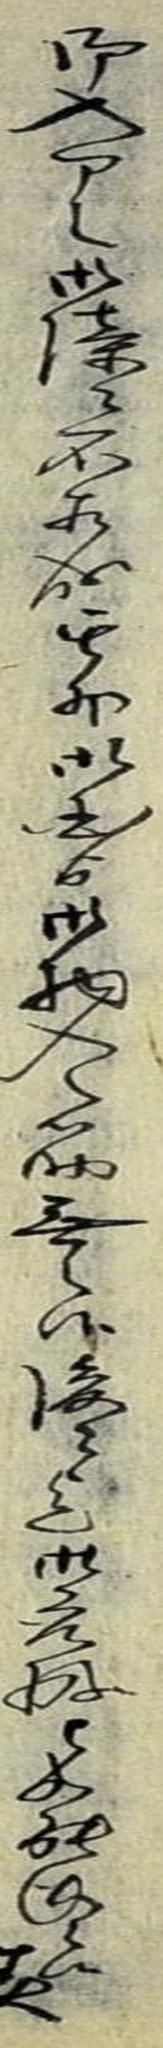御入部之御障に不相成其外御国ゟ御物入之筋無之候後々迄御取扱被成罷趣に候春
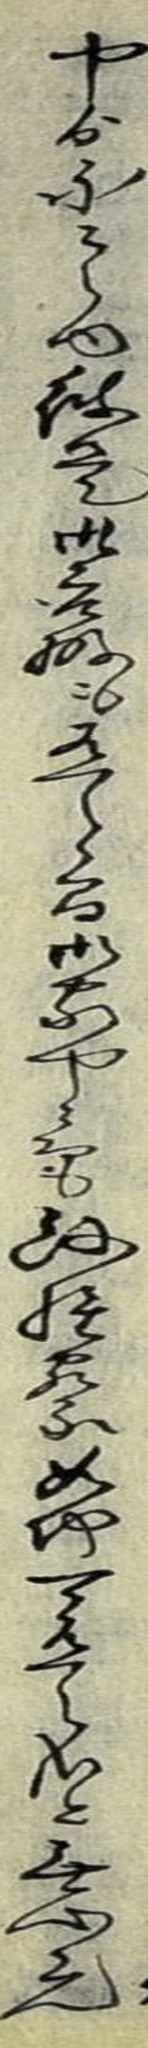中ゟ永々之内彼是御取扱も有之候間御家中に而も致推察如何可有之哉と無心元
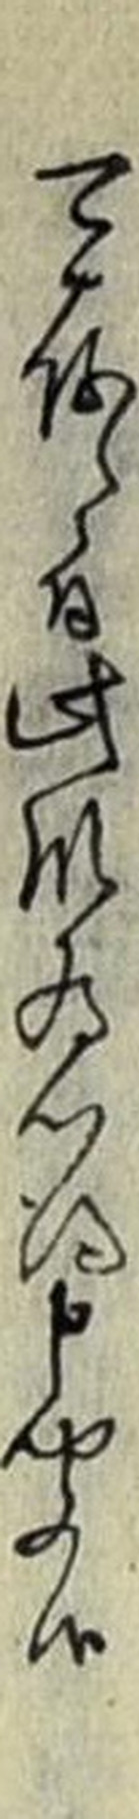可存候に付此段為心得申聞候
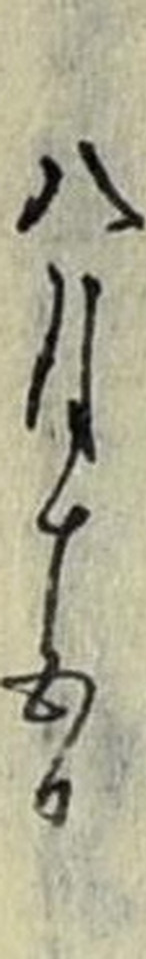八月十五日
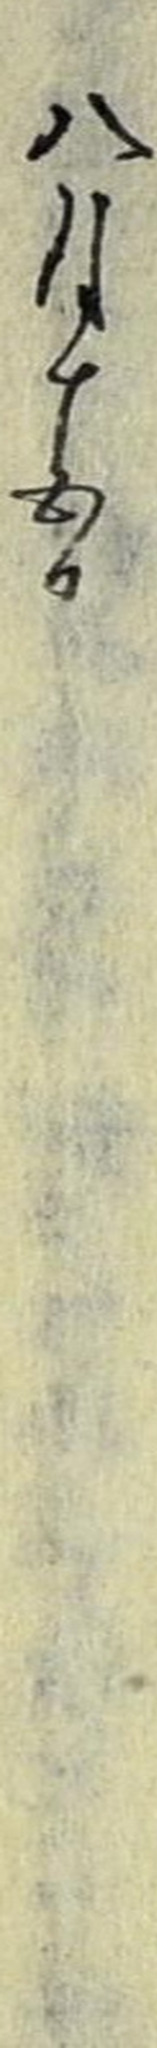八月十五日
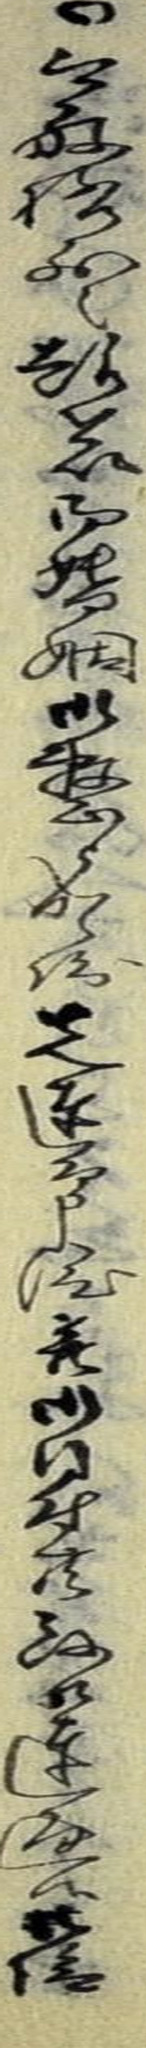〇今般格外之趣を以御婚姻御整被成候儀先達而申渡并御目付共致口達通候御倹
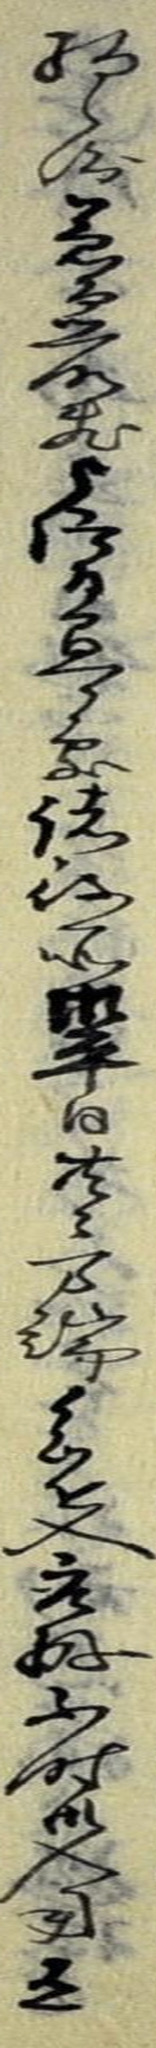約之儀兼而厳敷被仰付置候処諸役所御平日共に万端念を入取扱不時御入用有
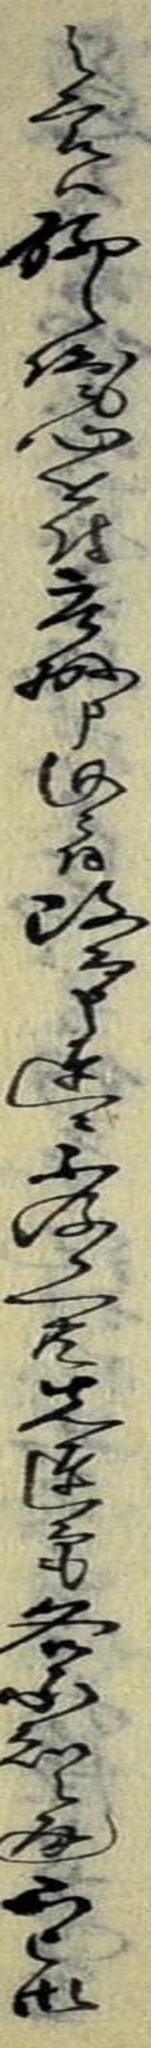之節は聊之儀も心を付取扱申趣に付改而申達に不及候へ共先達而も各承知之通不被御
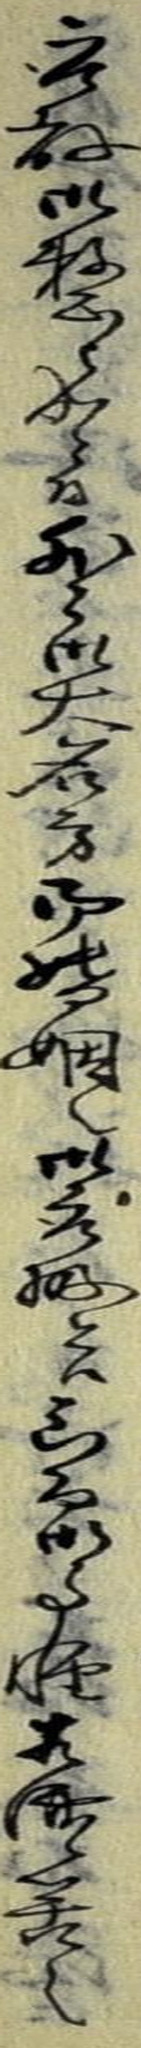取扱御整被成候に付外に御大名方御婚姻之御取扱とは至而御事軽相済候筈之
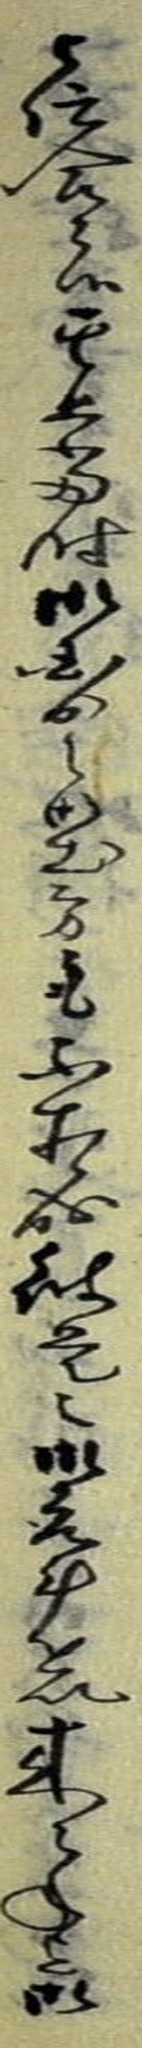被仰合に候其上当時御国ゟ之御出方にも不相成彼是之御取斗を以来年迄御
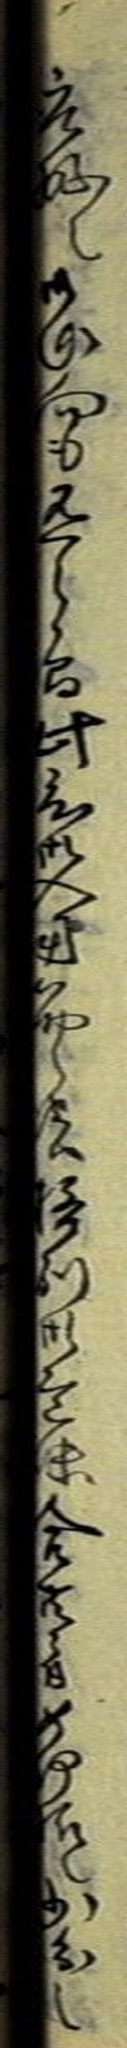取扱之御趣向も有之候間此度御入用筋之儀は格別御吟味合共に付如何様之少分之
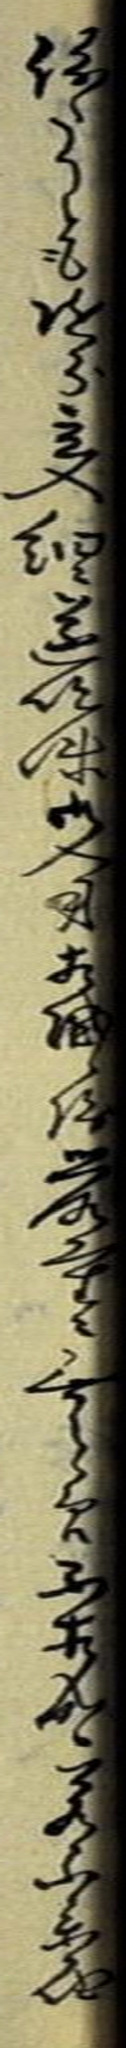儀たりとも随分立入細々遂吟味御入用相減候儀厳重に無之候而は不相成候若不参届
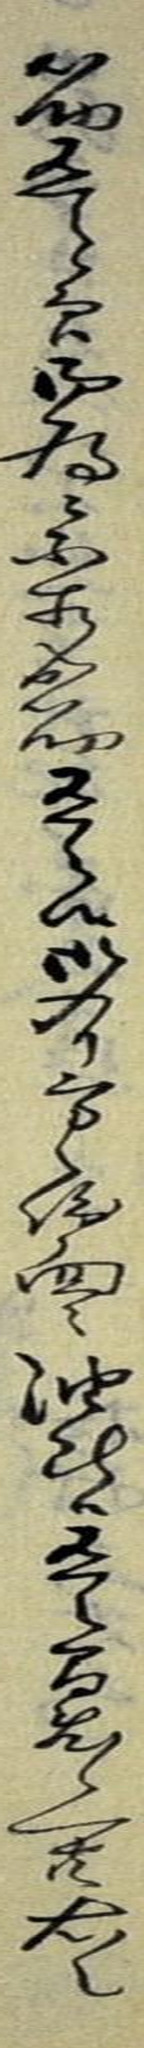筋有之候而は御為に不相成筋有之候御〆り方之儀面々油断は有之間敷候へ共右之
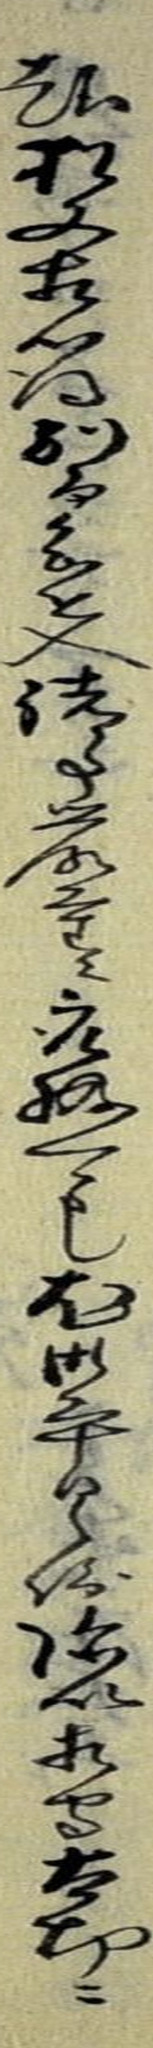趣猶又相心得別而念を入諸事厳重に取扱可申候尤御平日之儀弥以相守太切に
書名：命令之部 二
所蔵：福井県文書館 Fukui Prefectural Archives
